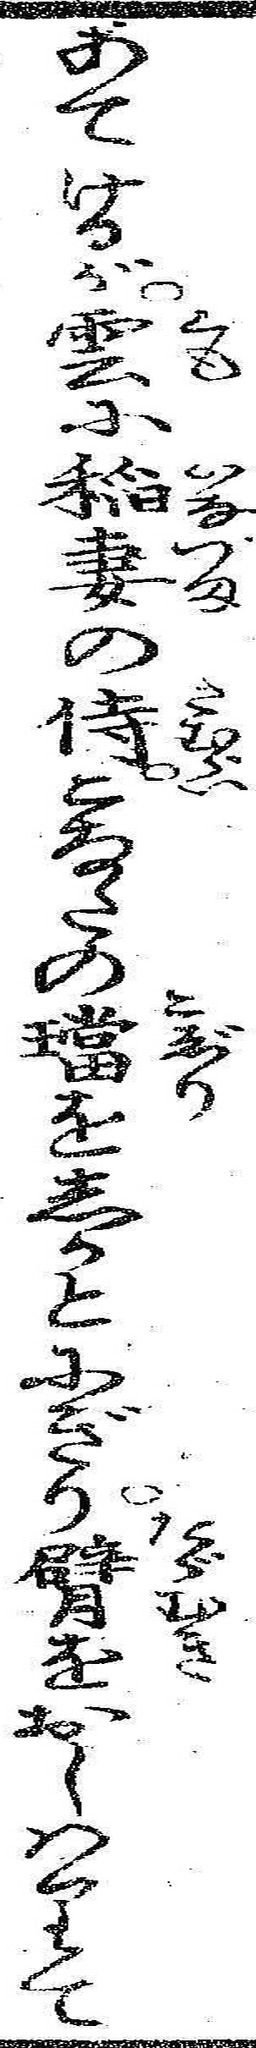あてけるが。雲に稲妻の侍。こなたの璫をしかとにぎり。臂をおしはりて
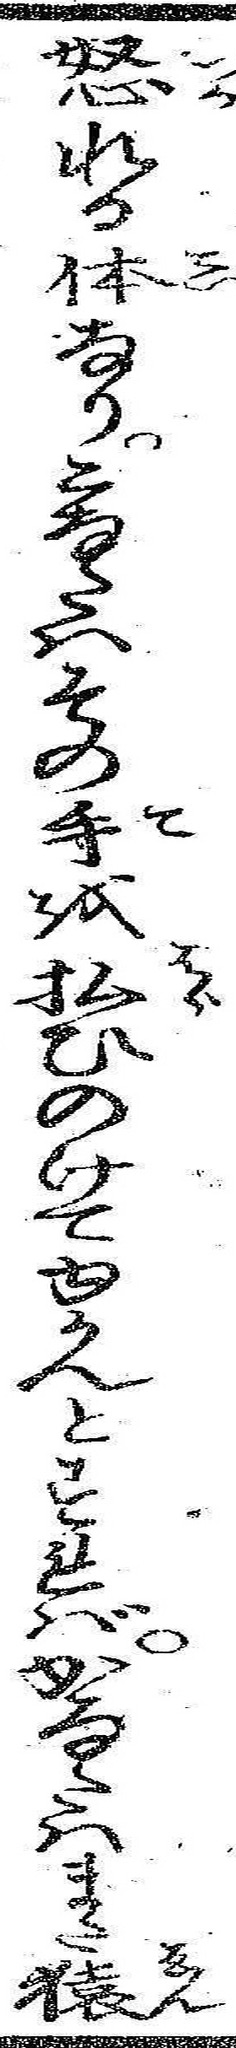怒れる体なり。こなたはその手を払ひのけてゆかんとすれば。かなたはまた猿
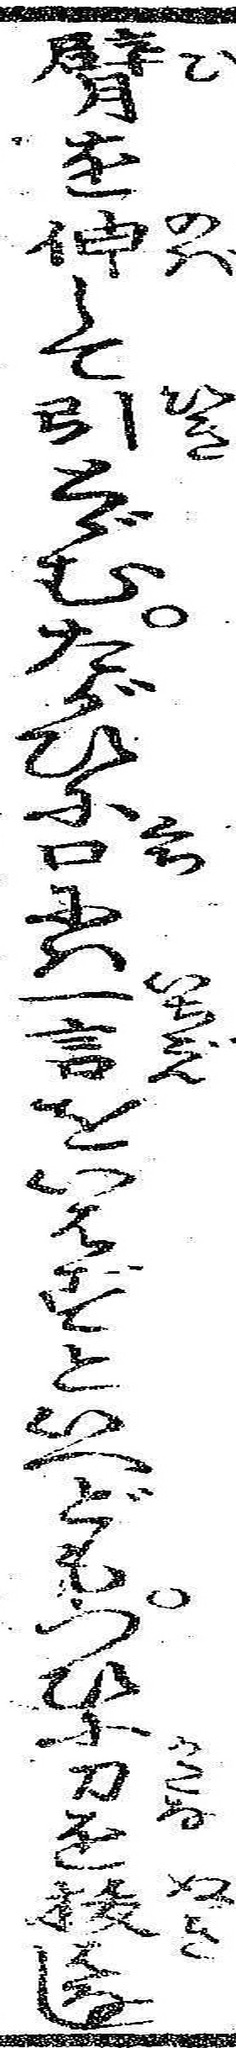臂を伸して引とゞむ。たがひに口には一言をいはずといへども。つひに刀を抜はなし
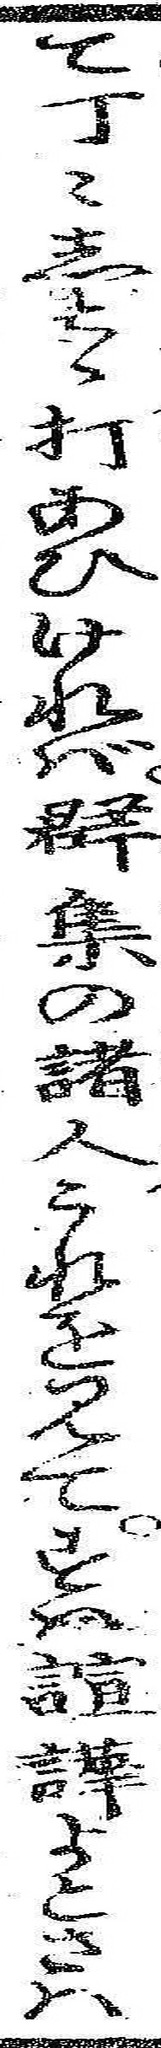て。丁々しとゝ打あひければ。群集の諸人これを見て。すは諠譁よとさは
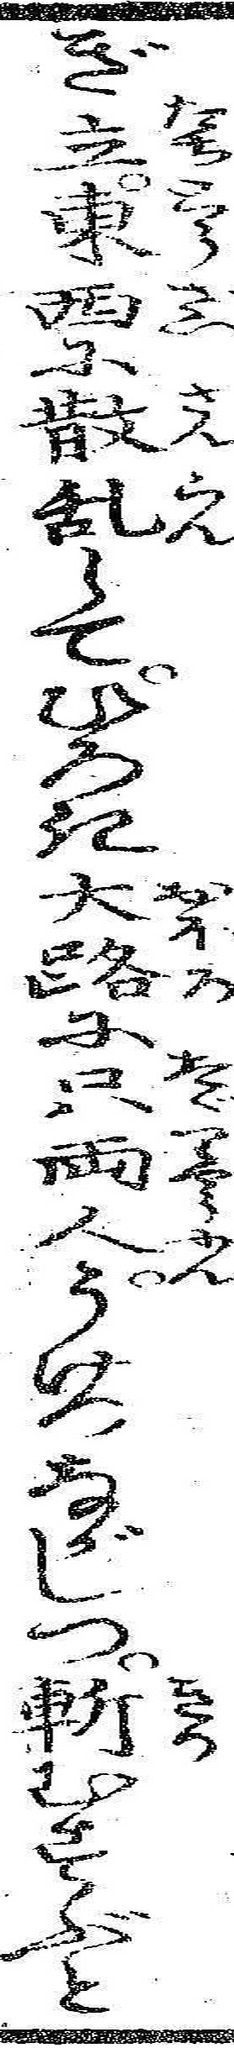ぎ立。東西に散乱して。ひろき大路に只両人。うけつながしつ。斬むすぶと
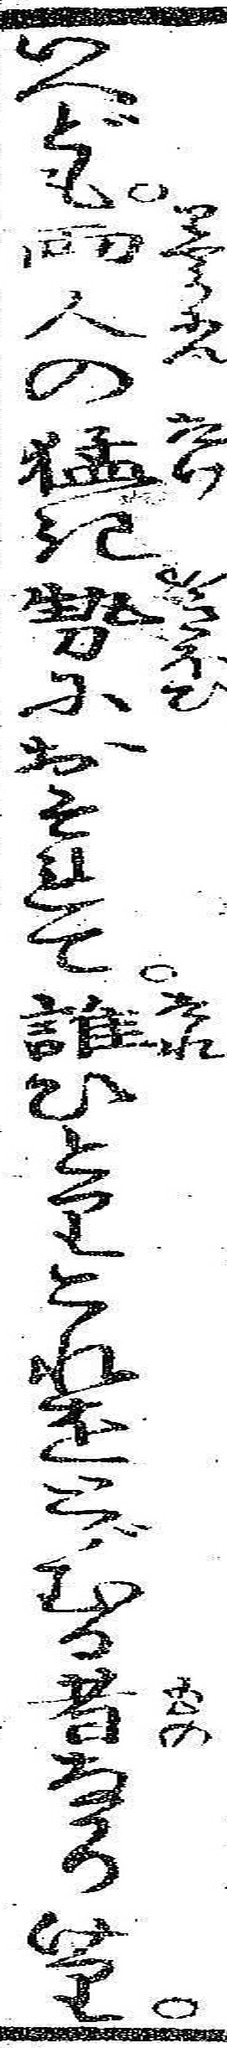いへども。両人の猛き勢におそれて。誰ひとりこれをとゞむる者なかりけり。
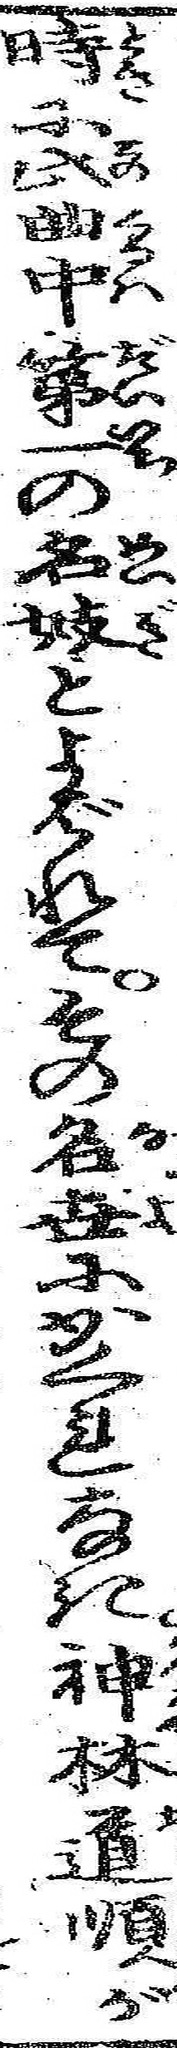時に此曲中第一の名妓とよばれて。その名世にかくれなき。神林道順が
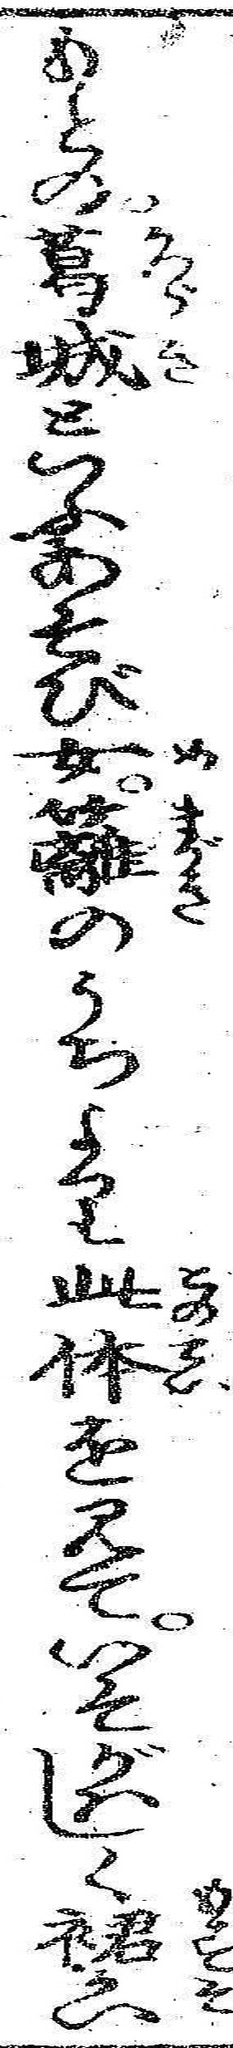もとの。葛城といふあそび女。籬のうちより此体を見て。いそがはしく裙かい
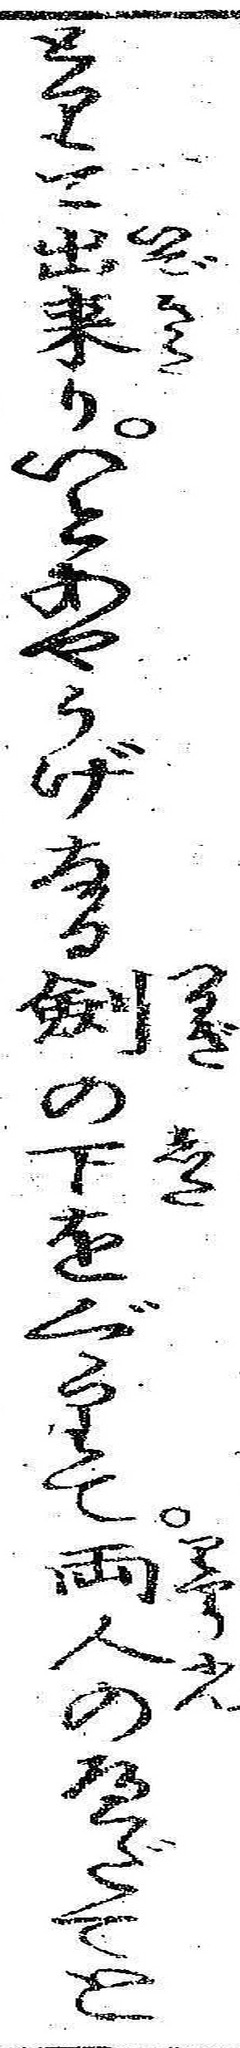とりて出来り。いとあやうげなる剣の下をぐゝりて。両人のへだてと
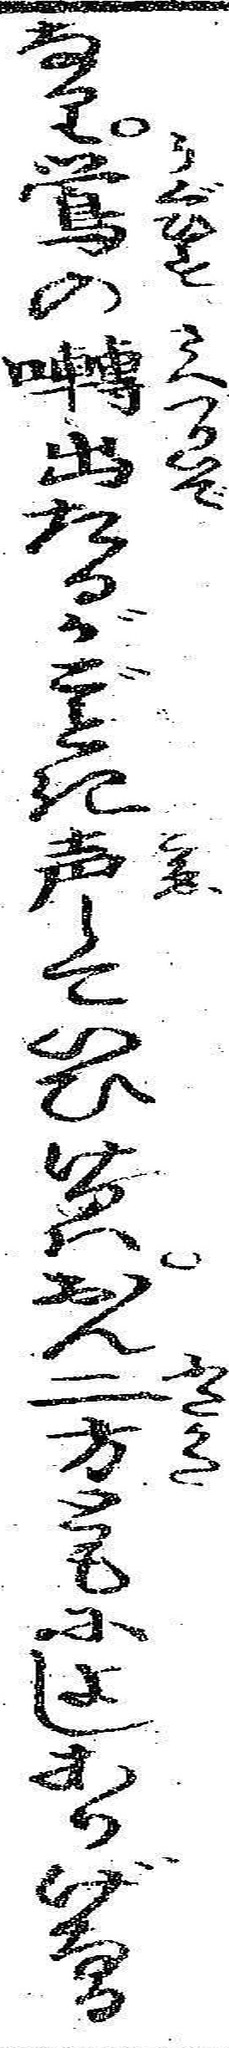なり。鴬の囀出たるがごとき声していひけるは。おん二方ともによしありげなる
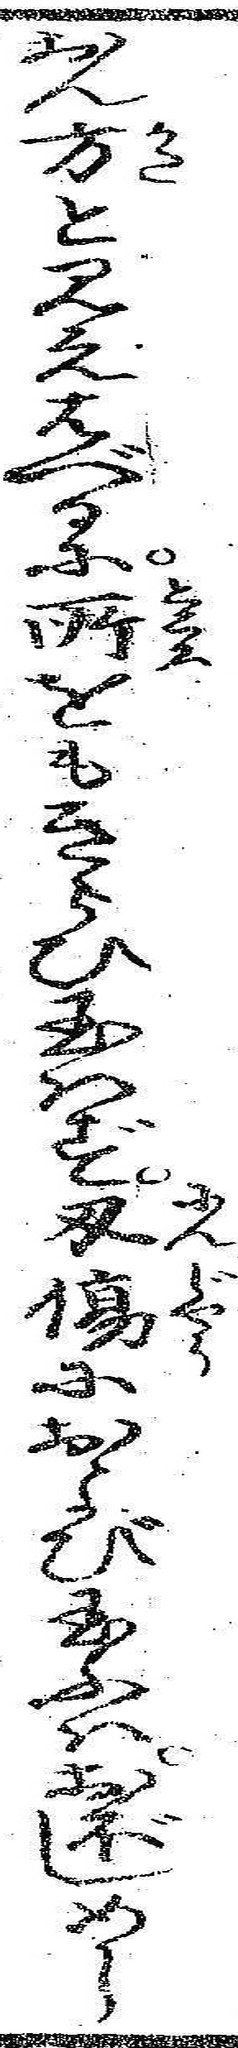おん方と見えはべるに。所をもきらひ玉はず。刃傷におよび玉ふは。おぼしめし
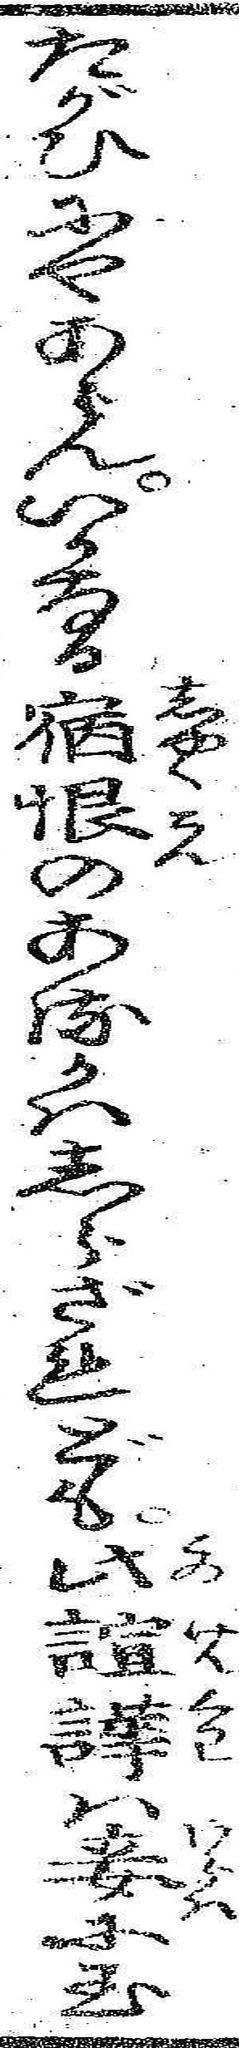たがひにやあらん。いかなる宿恨のあるかはしらざれども。此諠譁は妾に玉
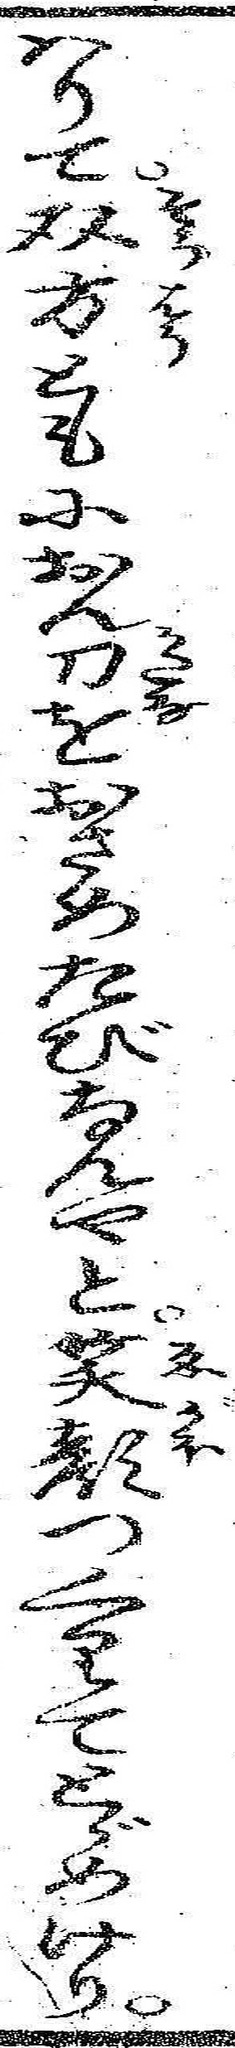はりて。双方ともにおん刀をおさめたびなんやと。笑顔つくりてとゞめけり。
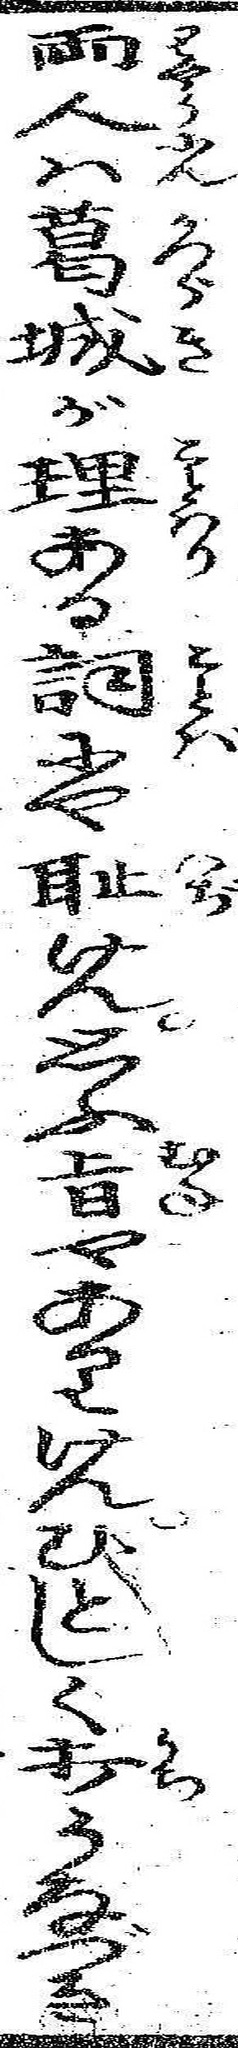両人は葛城が理ある詞にや恥けん。思ふ旨やありけん。ひとしく打うなづき
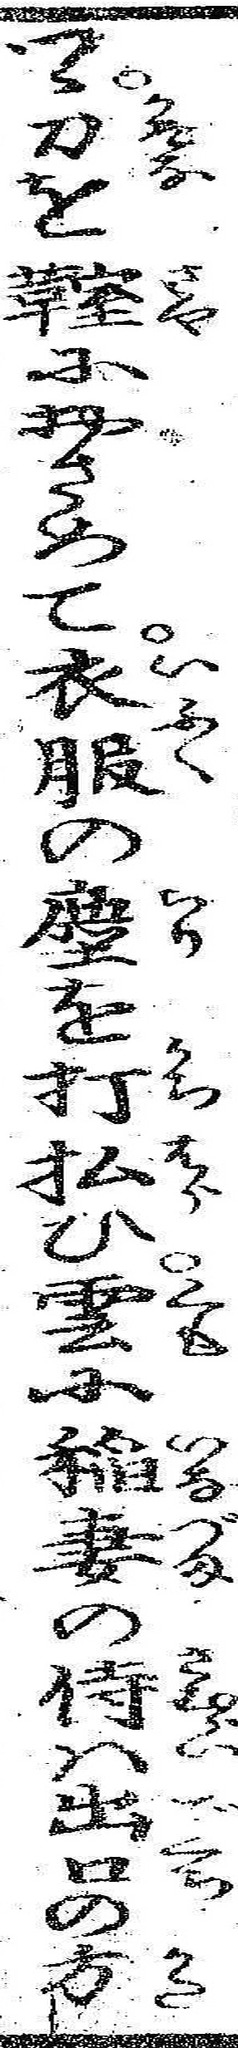つゝ。刀をにおさめて。衣服の塵を打払ひ。雲に稲妻の侍は出口の方
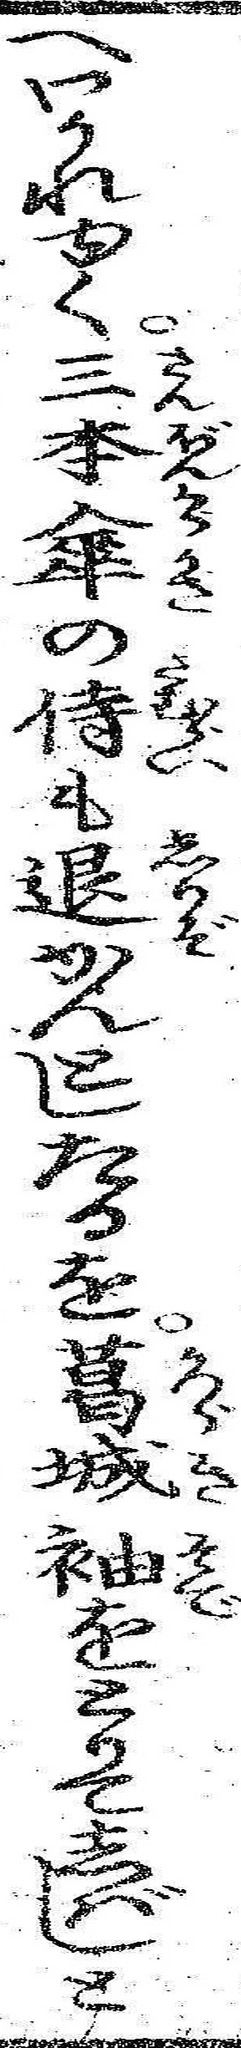へわかれゆく。三本傘の侍も退かんとしたるを。葛城袖をとりてしばしと
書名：昔話稲妻表紙
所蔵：国文学研究資料館
